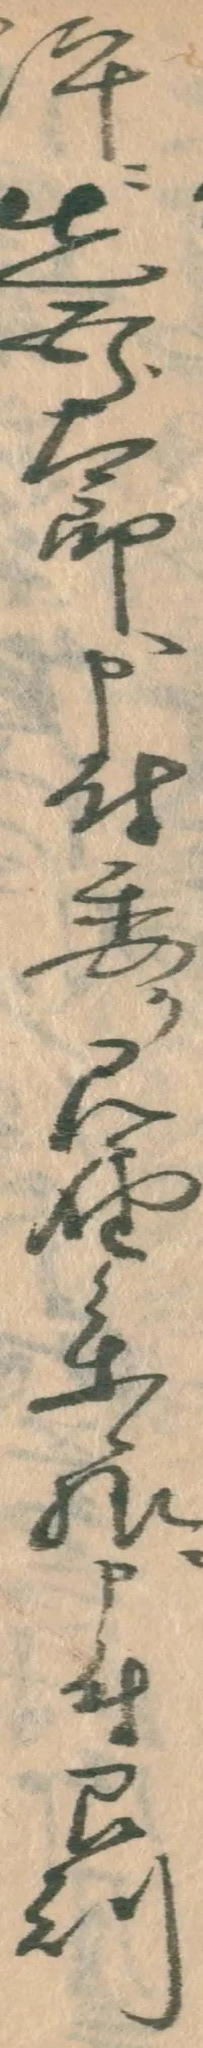評ニ先五郎太郎へ申付委ク見届参候様ニ申付即刻
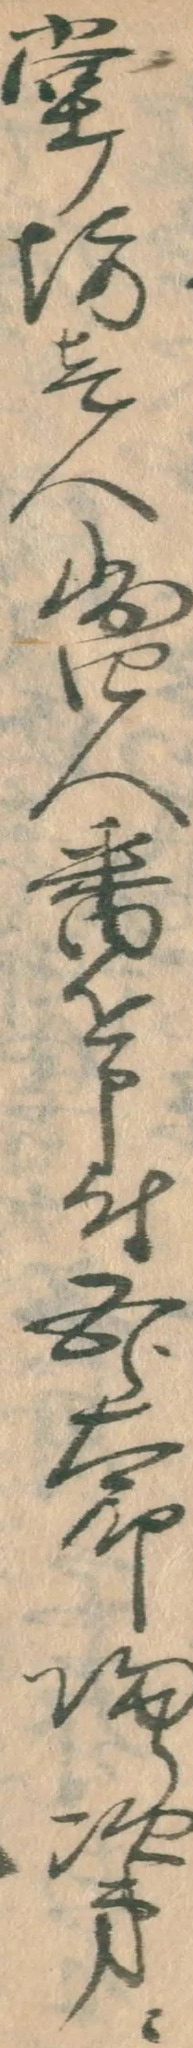堂ノ坊壱人歩四人番を申付五郎太郎帰り次第ニ
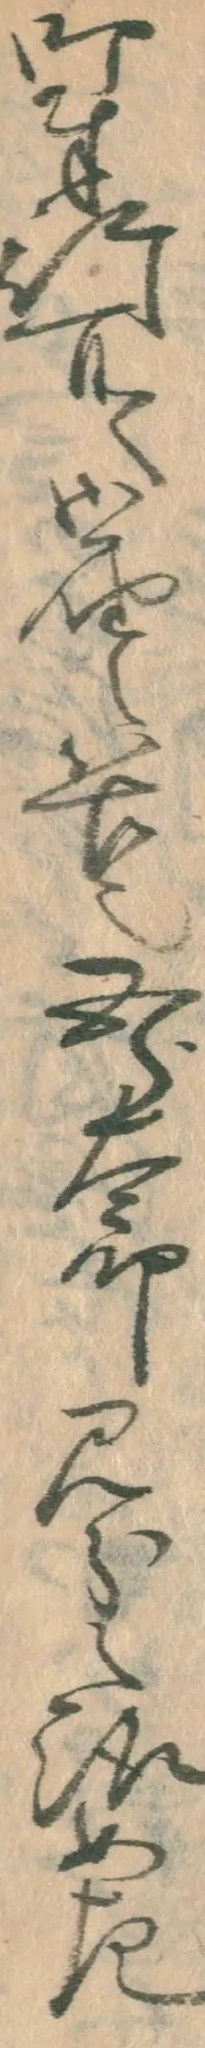御奉行所へ御届之筈也五郎太郎見分之趣如左
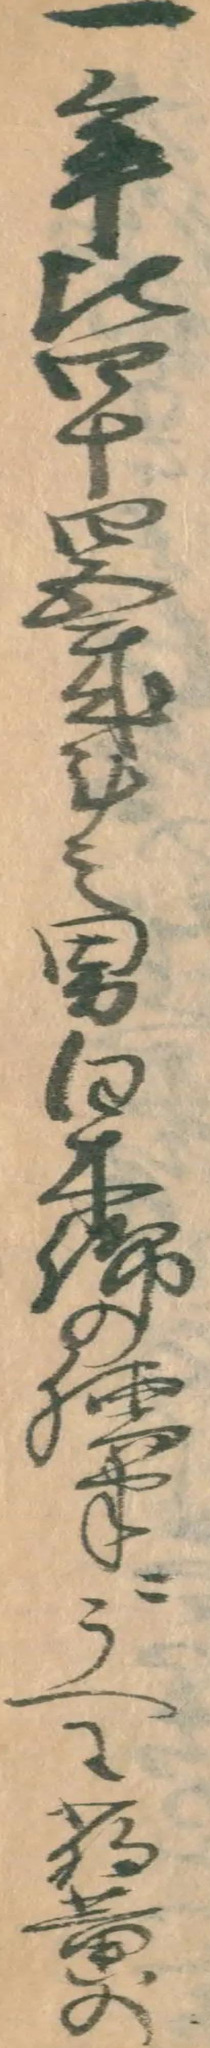一年比四十四五歳計之男白木綿の繻半ニうへわ萌黄の

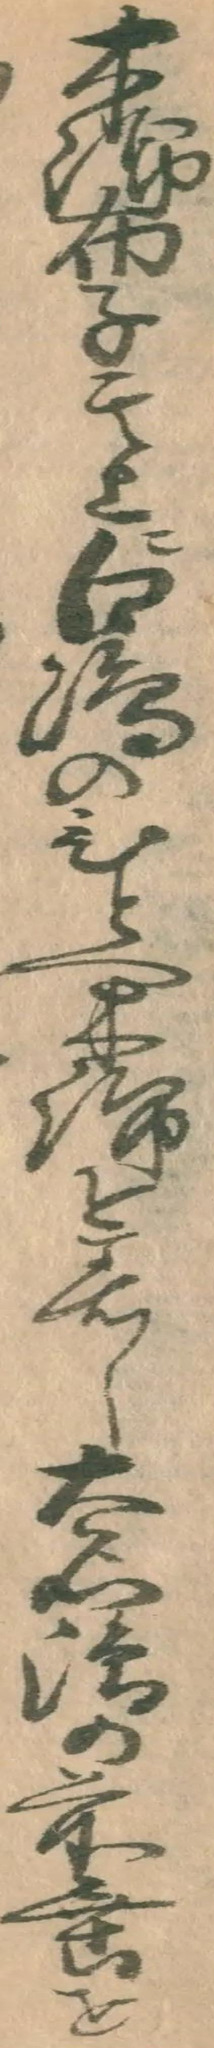木綿布子其上ニ白嶋のひとへ木綿を着し大名嶋の前垂を
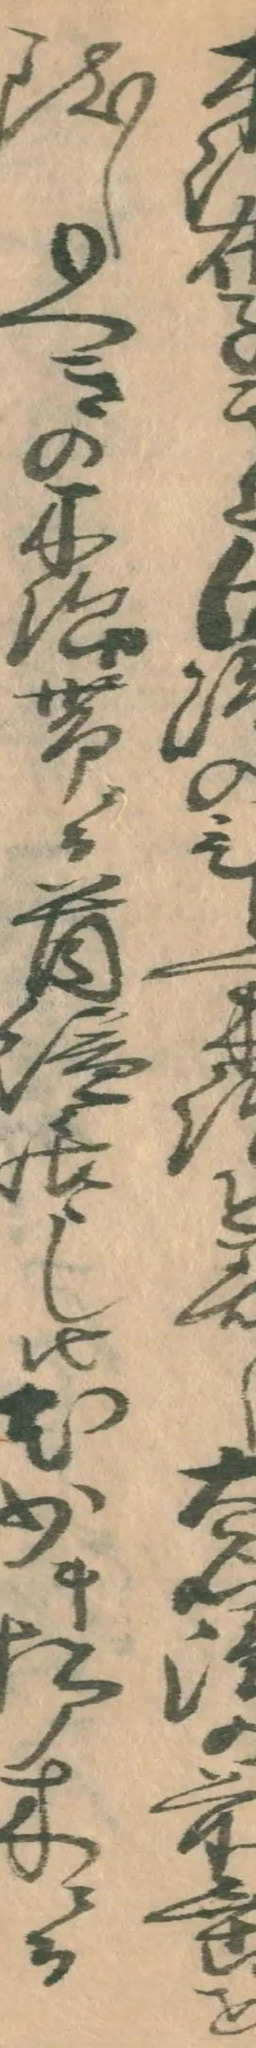致しもへきの木綿帯ニ而首縊居申候由尤少キ松ノ木ニ而
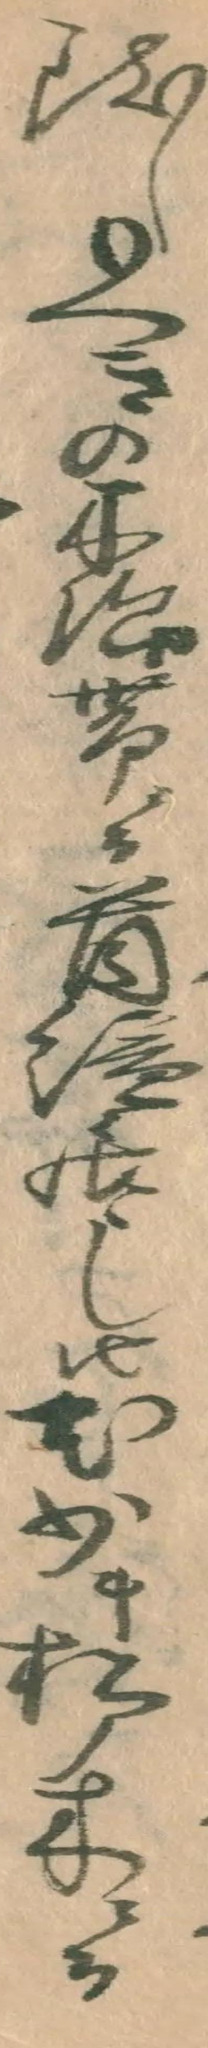致しもへきの木綿帯ニ而首縊居申候由尤少キ松ノ木ニ而
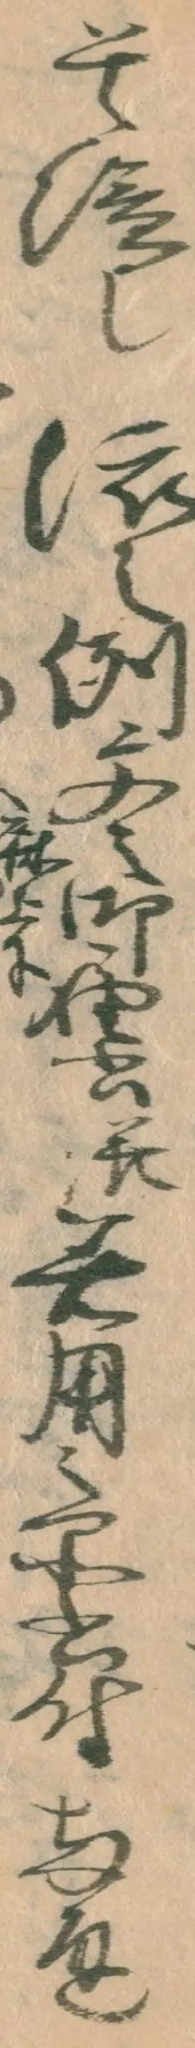首縊申候依之例文之御届書幷着用之品書付両通
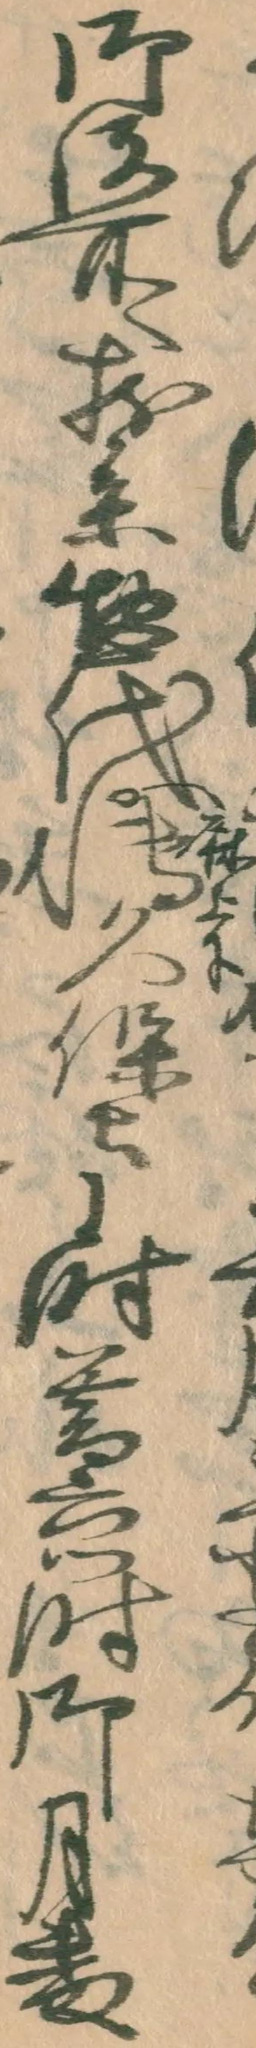御役所へ持参惣代◦麻上下博久保七于時暮六ツ時御月番
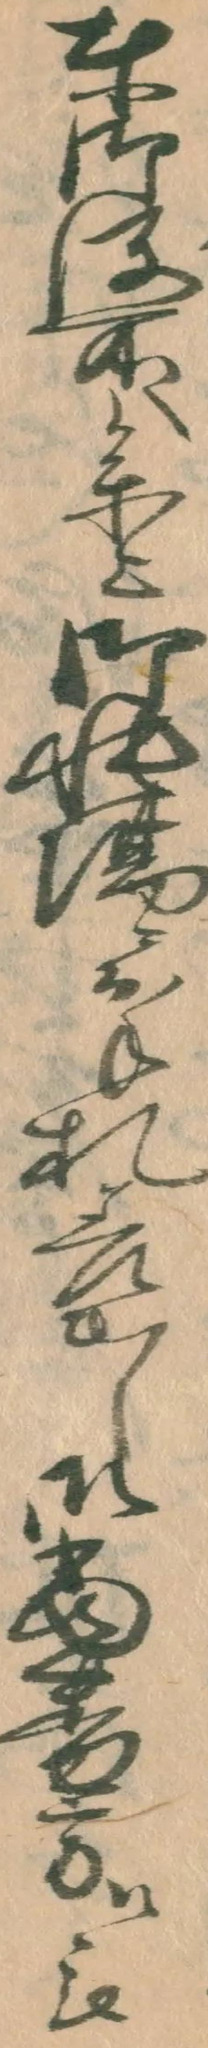東御役所へ参上御帳場ニ而手札差出し御当番方江被
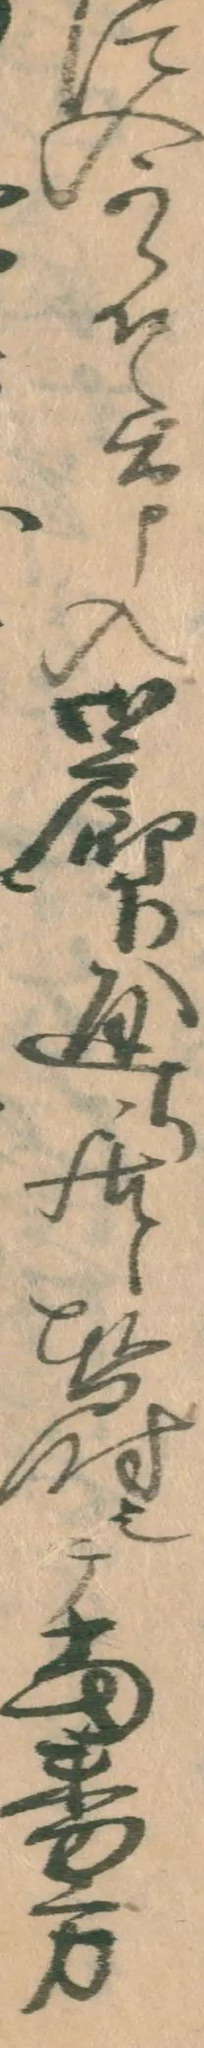仰入可被下候旨申入御廊下へ通り居候暫時シテ当番方
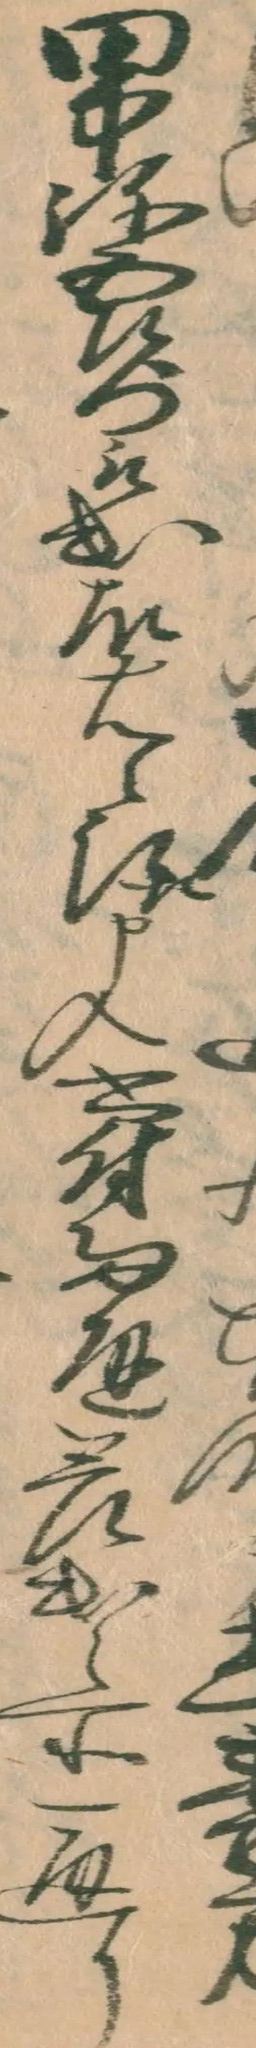田中弥五左衛門被出故右之趣申入書付両通差出候所一通り
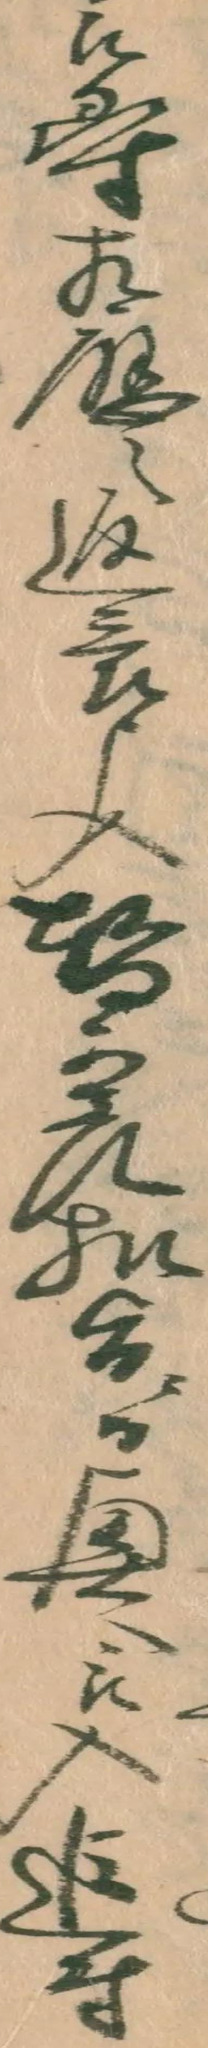被尋相応之返言申入暫可差扣旨ニ而奥へ被入追付
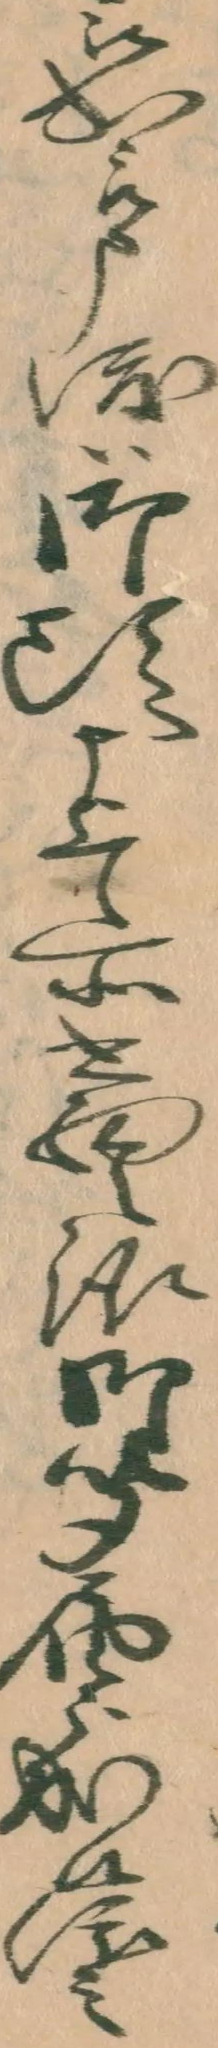被成被申渡ハ御頭へ申上候所書面之趣御聞届被成候依之
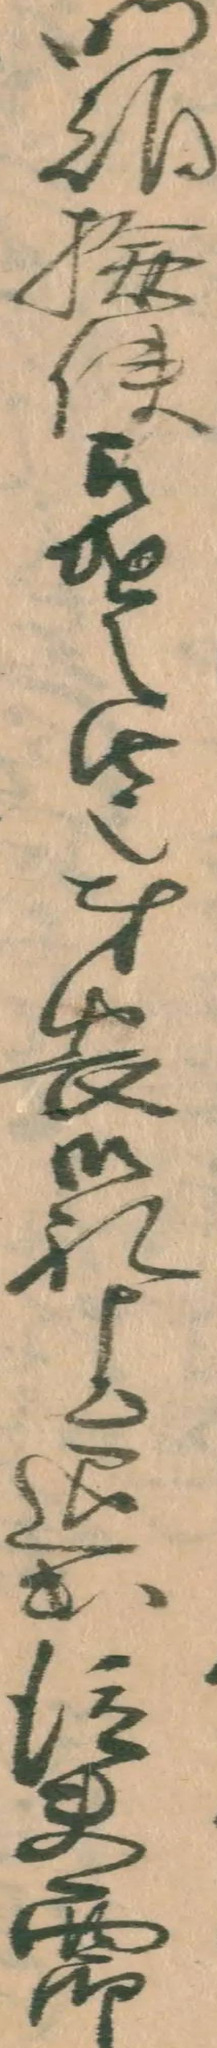明朝検使被遣之由也奉畏御礼申上退出従夫西御
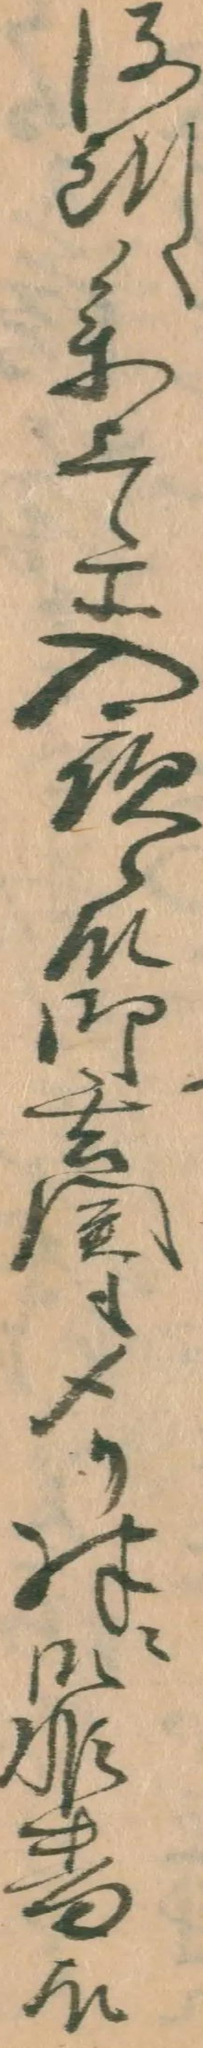役所へ参上候所入夜候故御玄関も〆り殊ニ御非番故
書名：賀茂社記録. 第60冊
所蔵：国立国会図書館 National Diet Library, JAPAN
